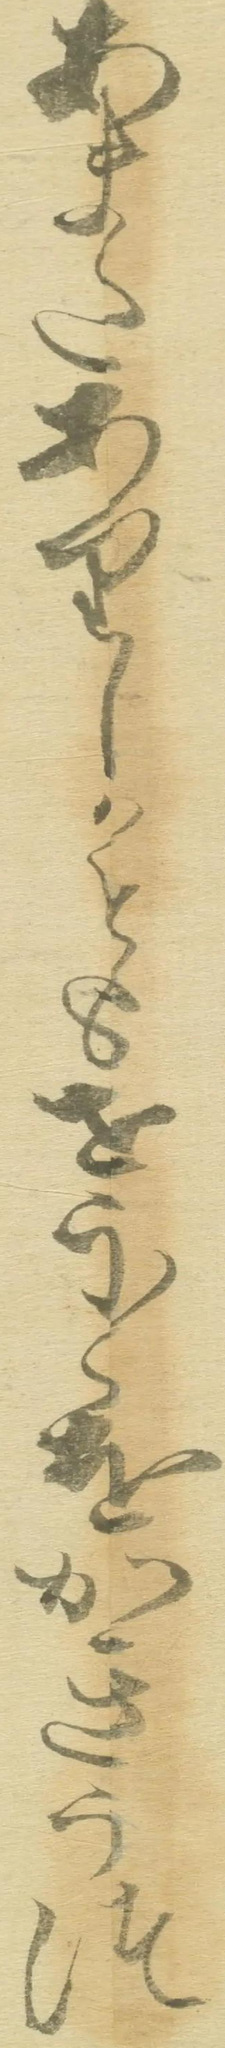あまたありしかともせう〳〵をかきうつ
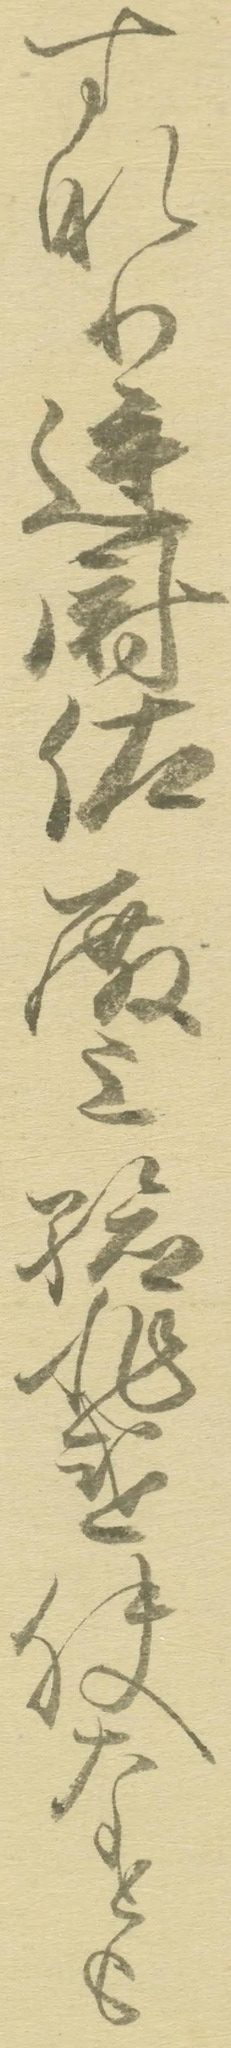すなり廷尉佐殿上撿非違使なとも
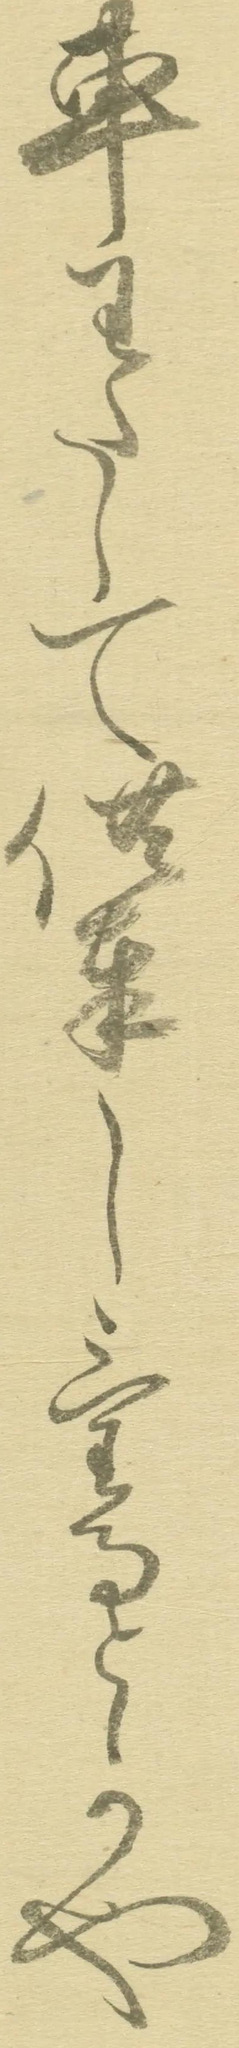車わたして供奉しけるとかや
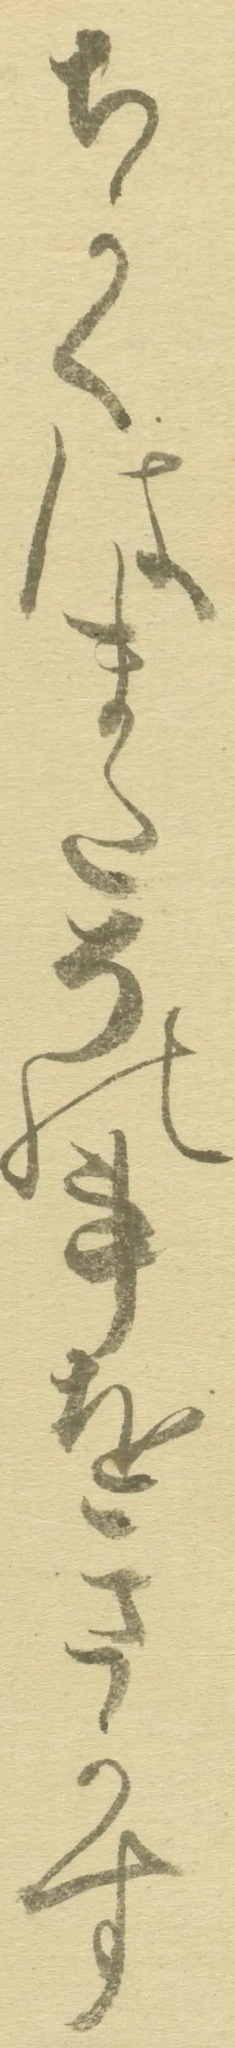ちかくはまたその事をきかす

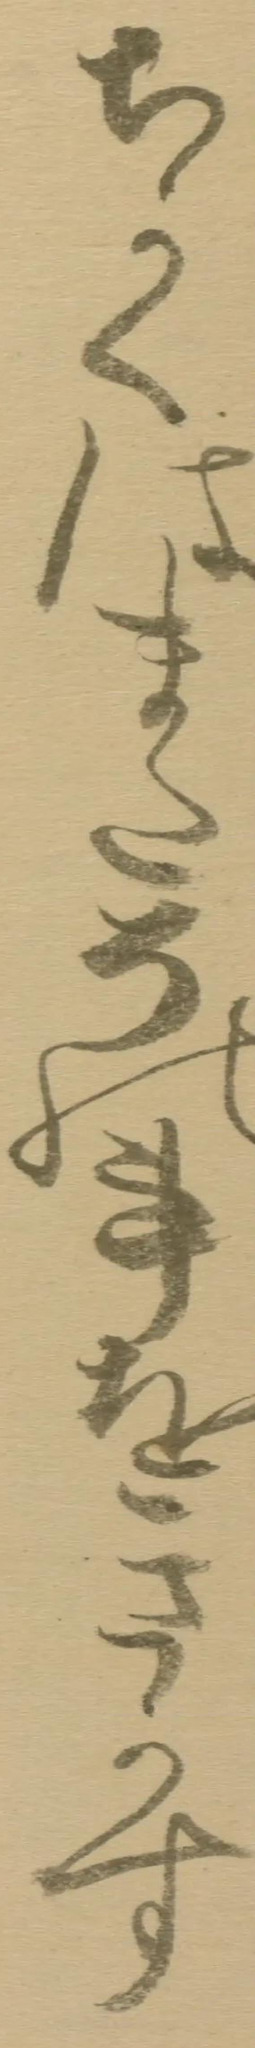ちかくはまたその事をきかす

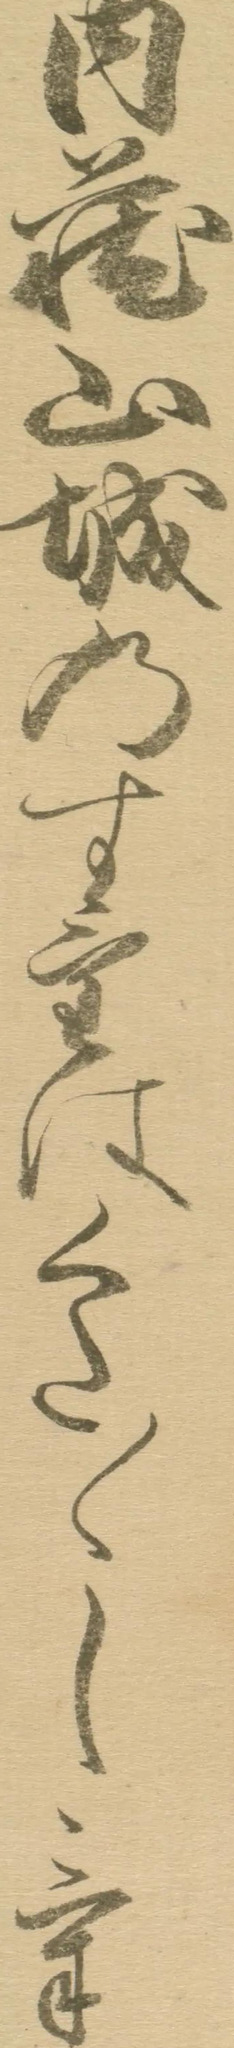内蔵山城のすけはくた〳〵しけ

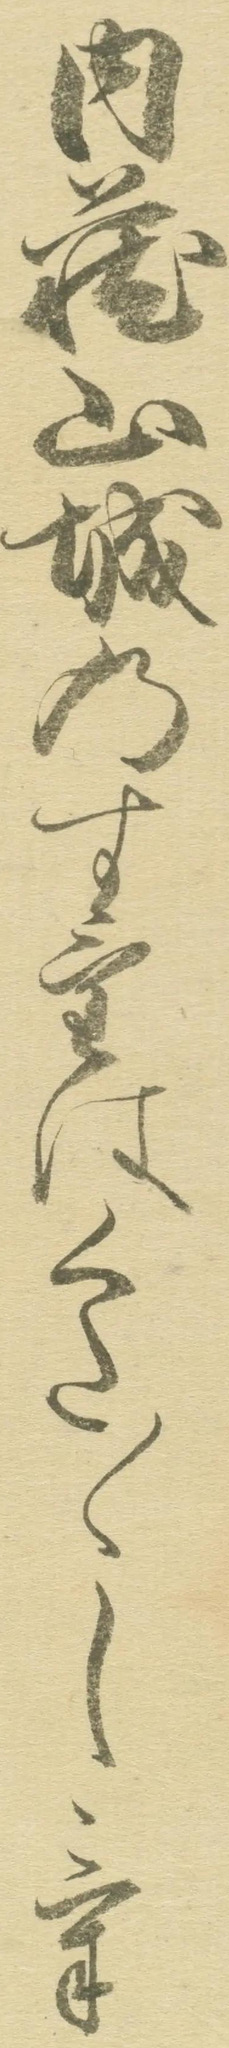内蔵山城のすけはくた〳〵しけ
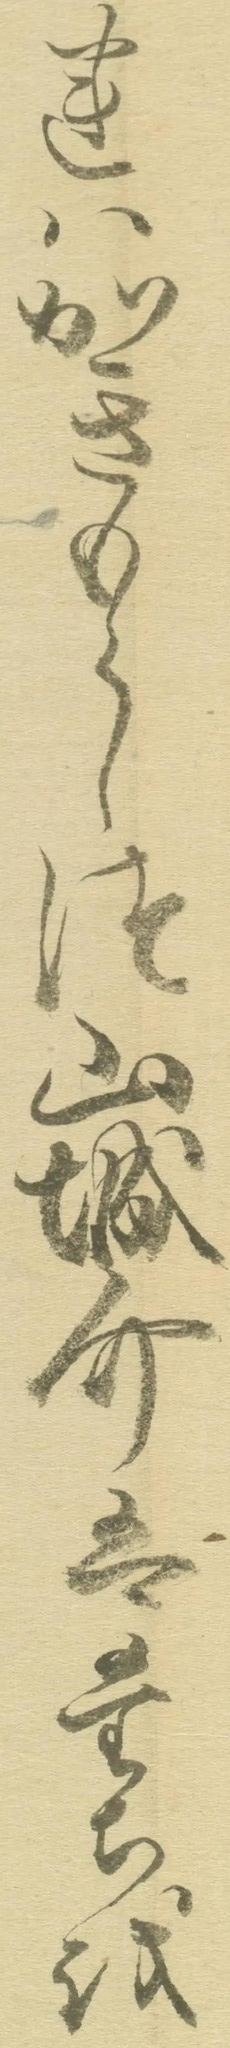れはかきもらしつ山城介はたちを
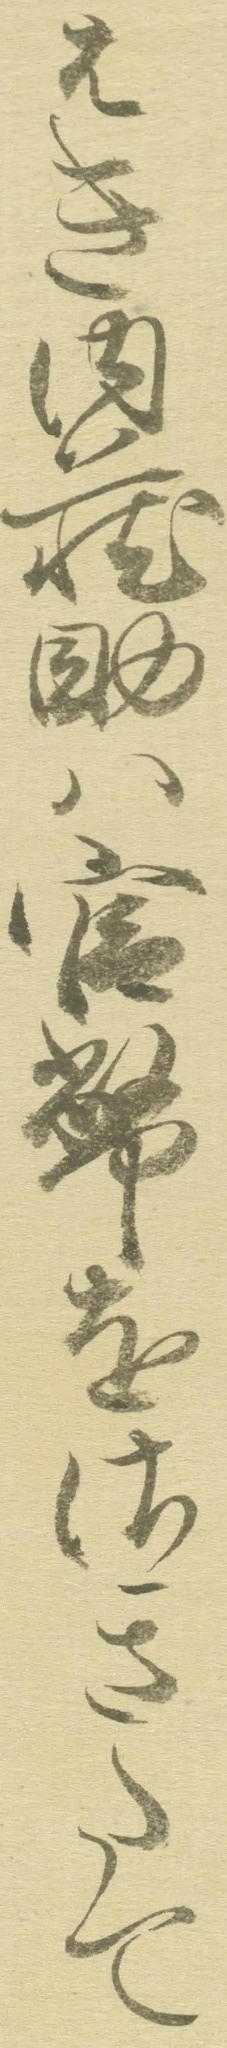はき内蔵助は官幣をさきたて
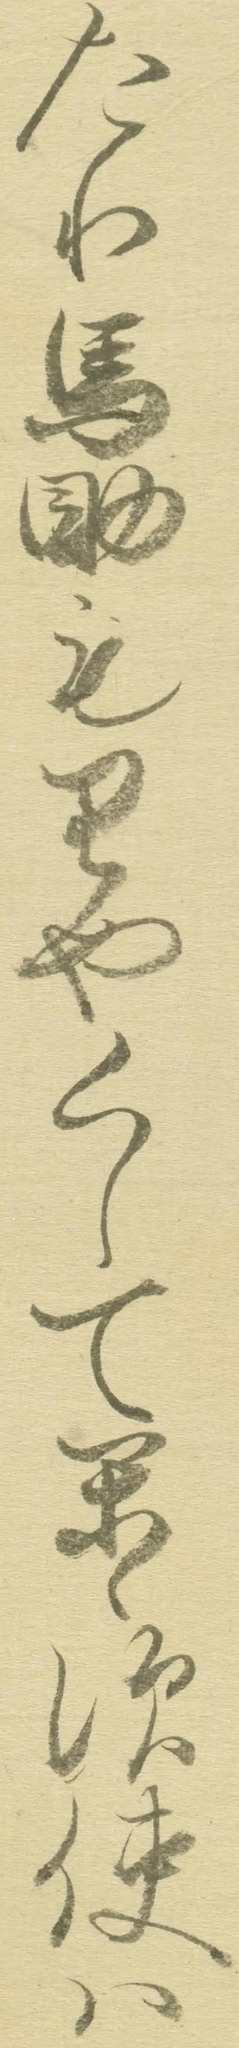たり馬助もりやくしてかゝす使は
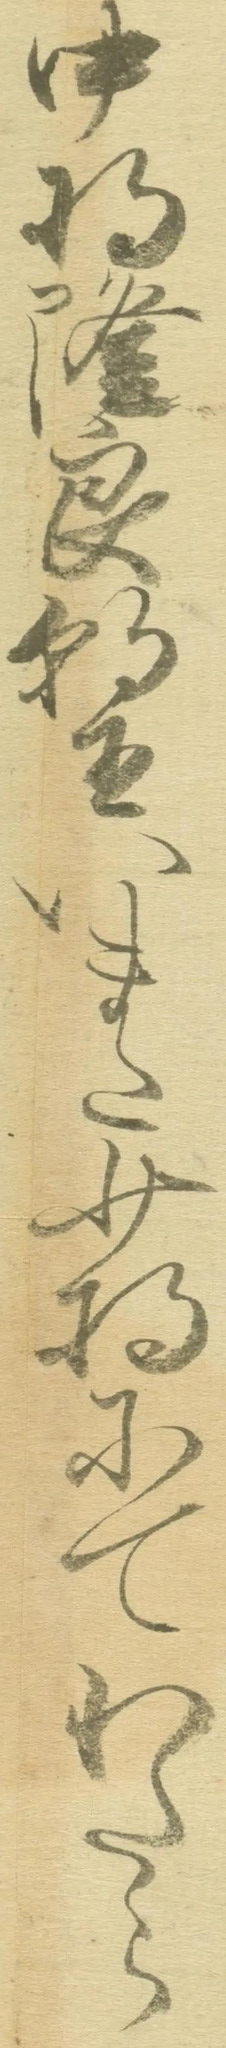中将隆良朝臣いまた少将にてわたら
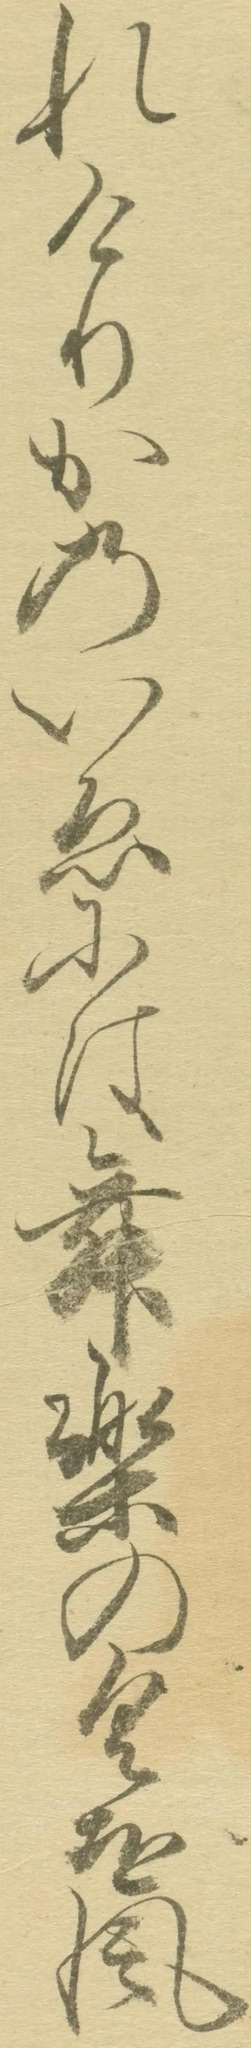れけりかのいゑには舞楽の具を風
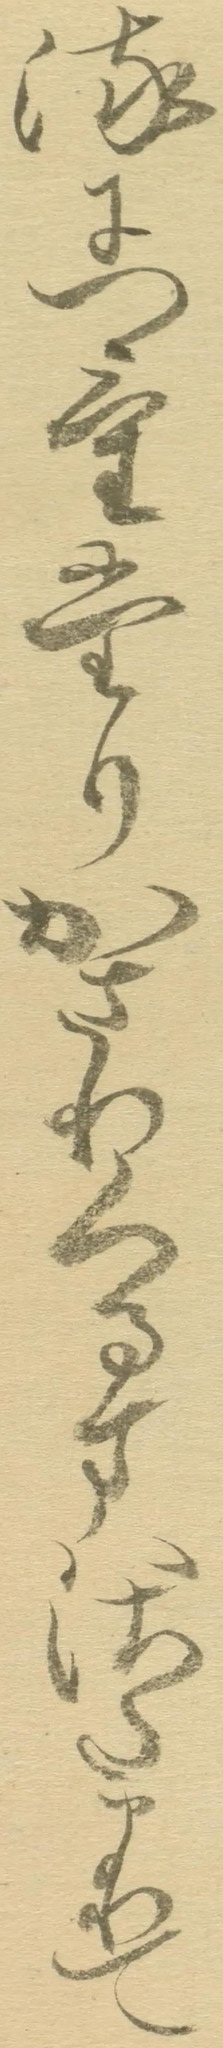流につけたりかさりくるまはさたまりて
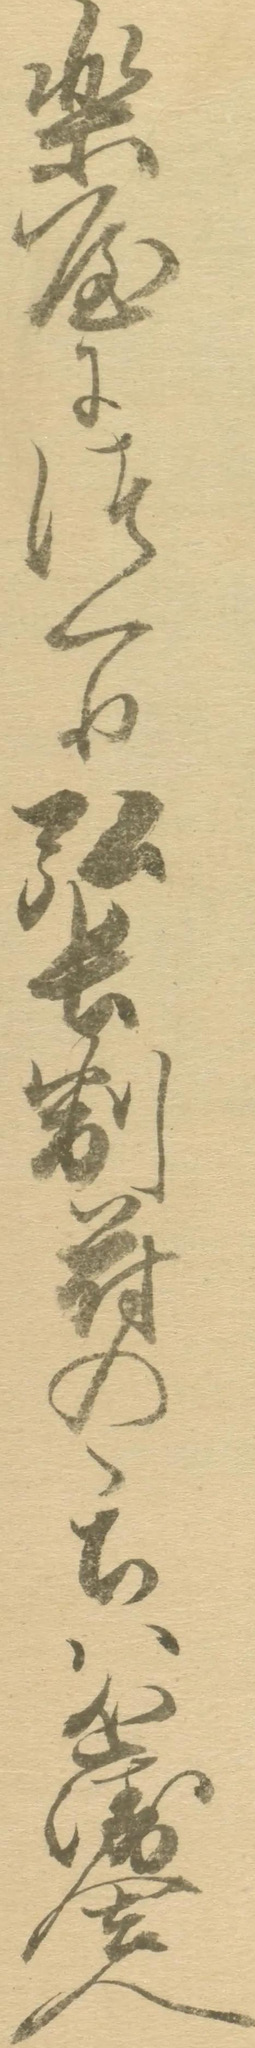楽屋につくり弘長制符のゝちは近衛舎人
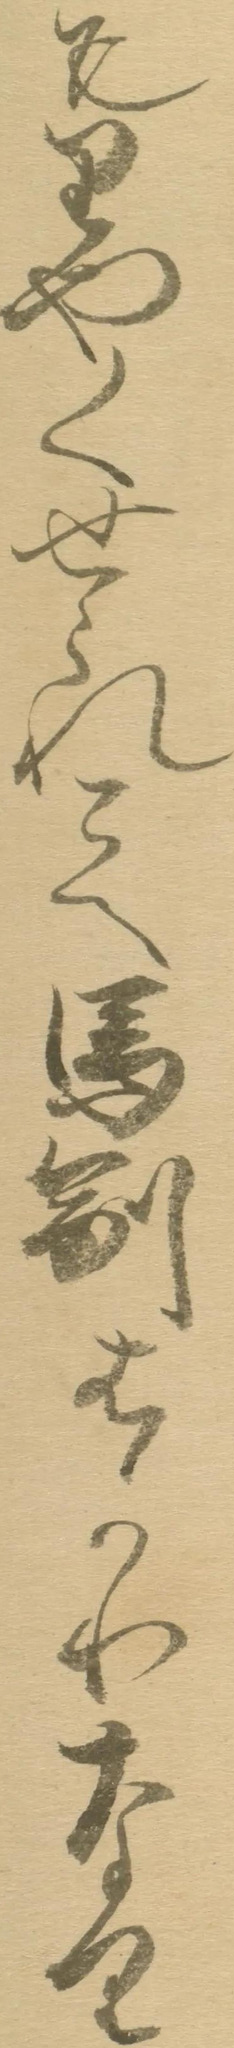もりやくせられて馬副はかりなり

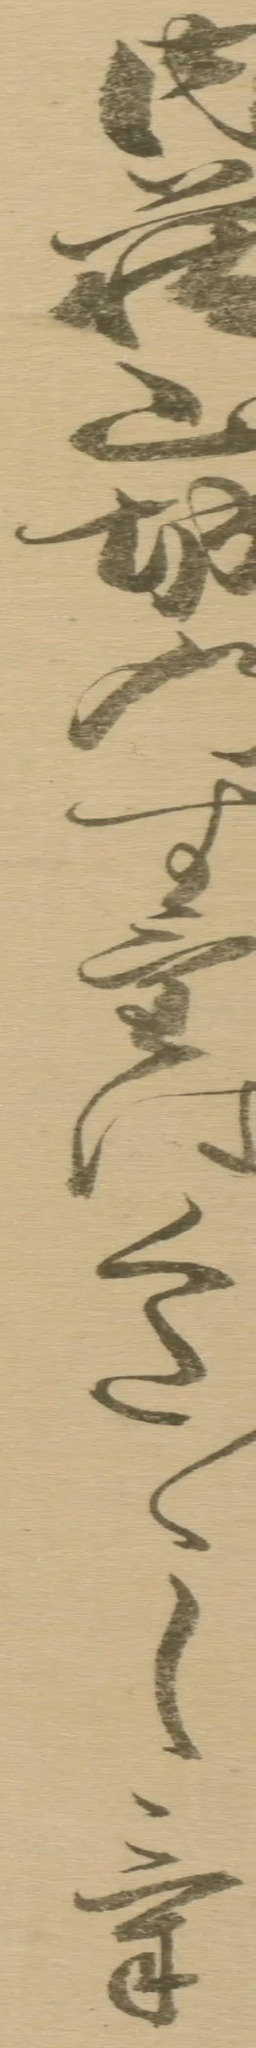内蔵山城のすけはくた〳〵しけ
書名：賀茂祭縁起
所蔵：国立国会図書館 National Diet Library, JAPAN
